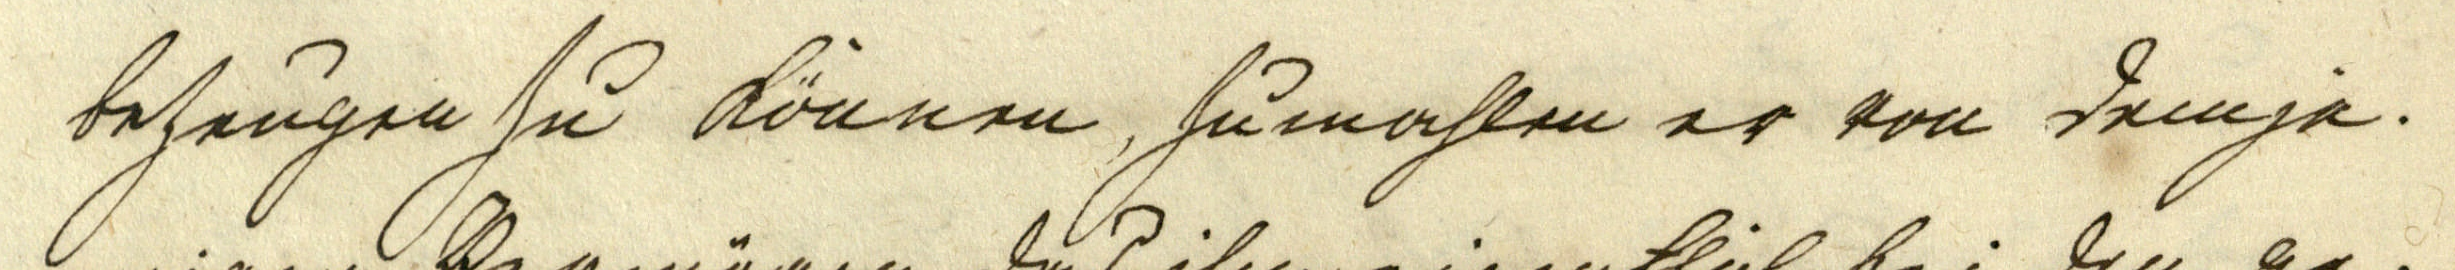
bezeugen zu können, zumahlen er von demje-
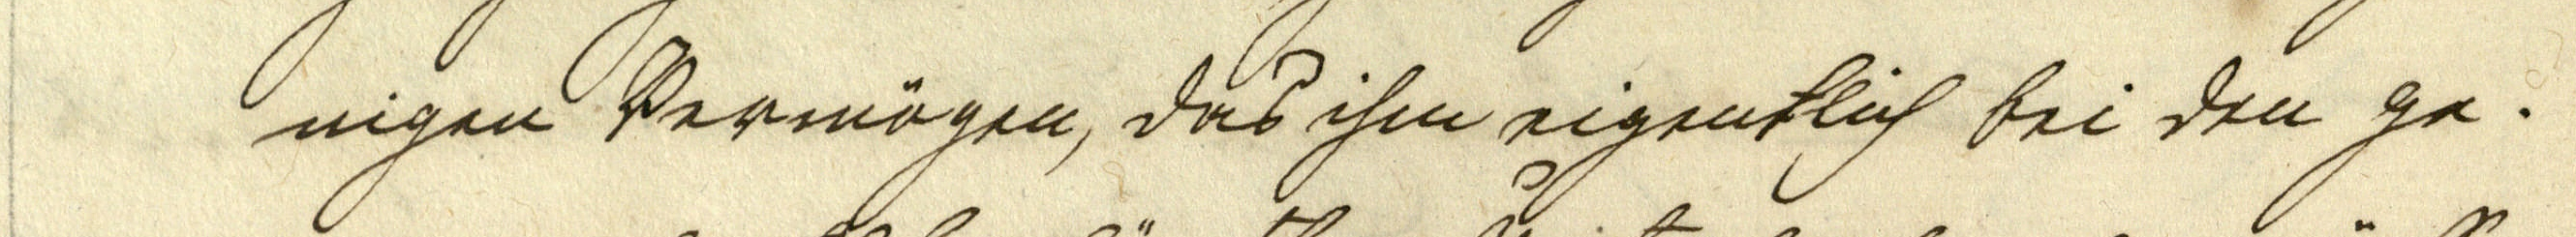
nigen Vermögen, das ihm eigentlich bei den ge-
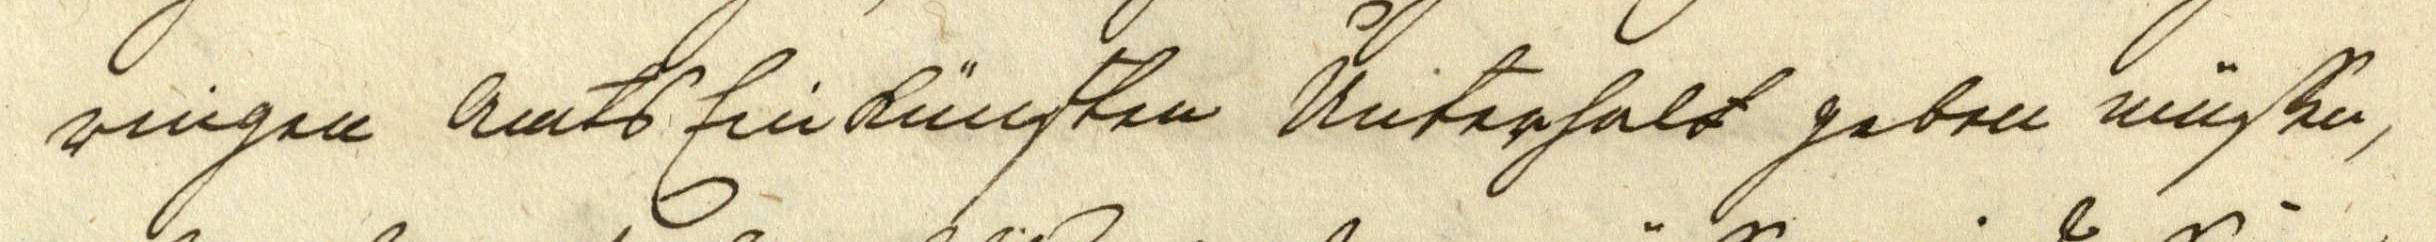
ringen Amts Einkünften Unterhalt geben müsste,
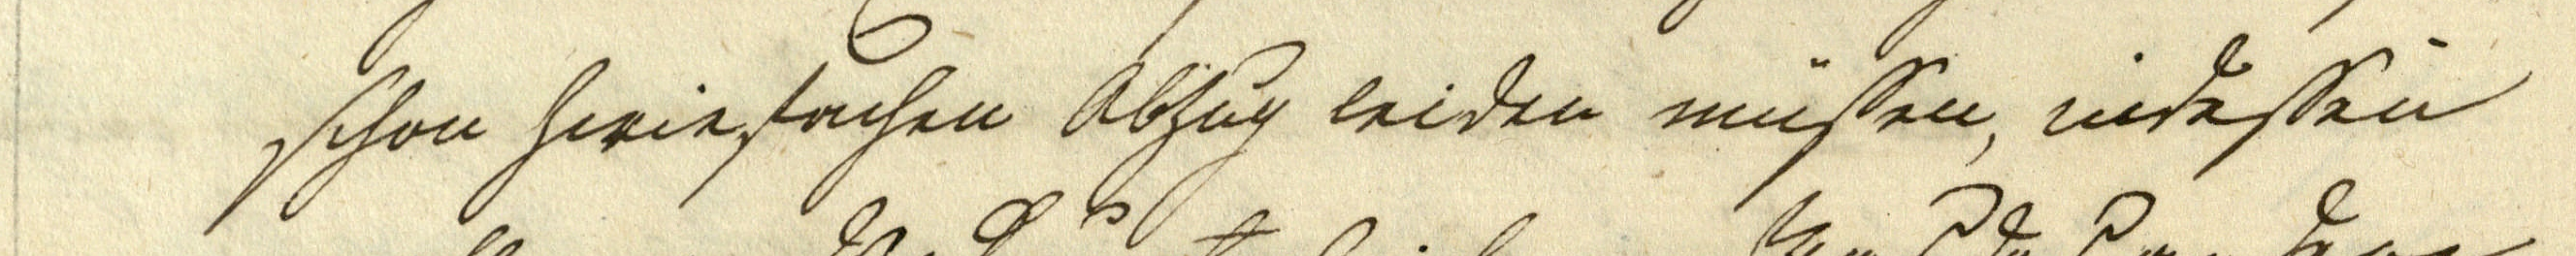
schon zwiefachen Abzug leiden müssen, indessen
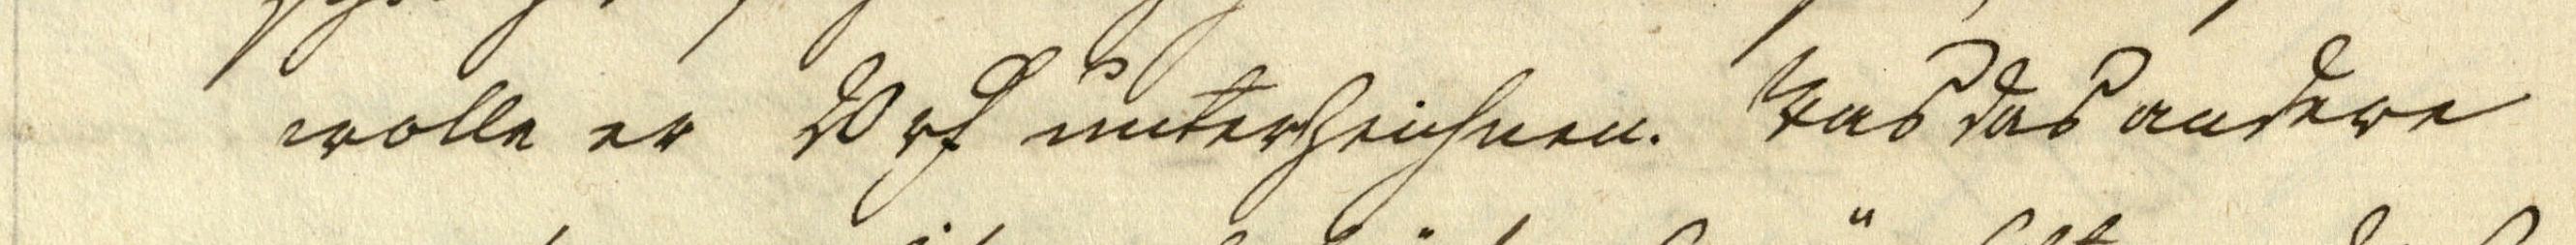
wolle er 20 rth unterzeichnen. Was das andere
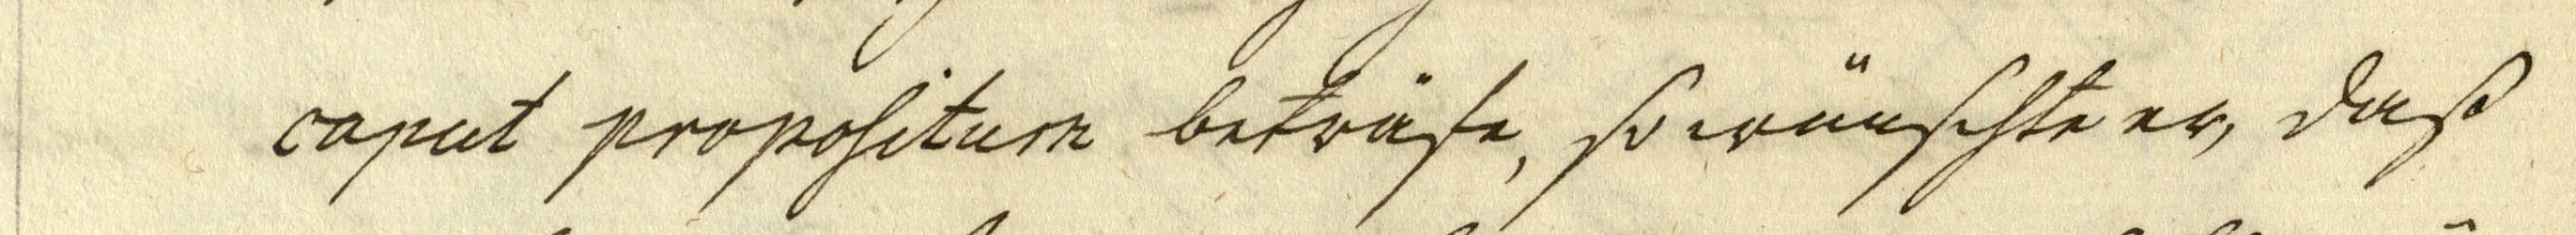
caput propositum beträfe, so wünschte er, daß
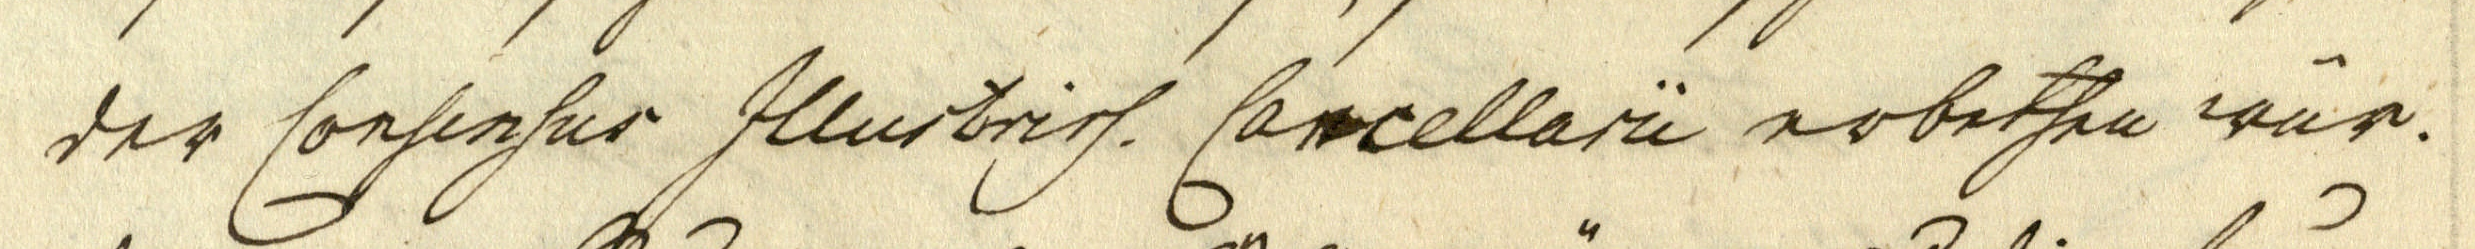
der consensus Illustriss. Cancellarii erbethen wür-
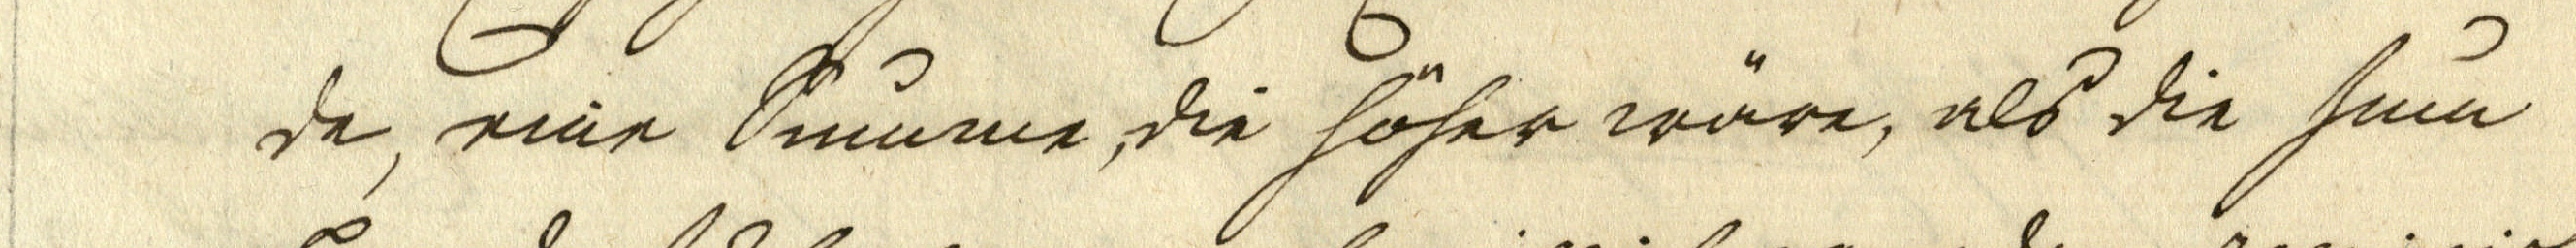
de, eine Summe, die höher wäre, als die zum
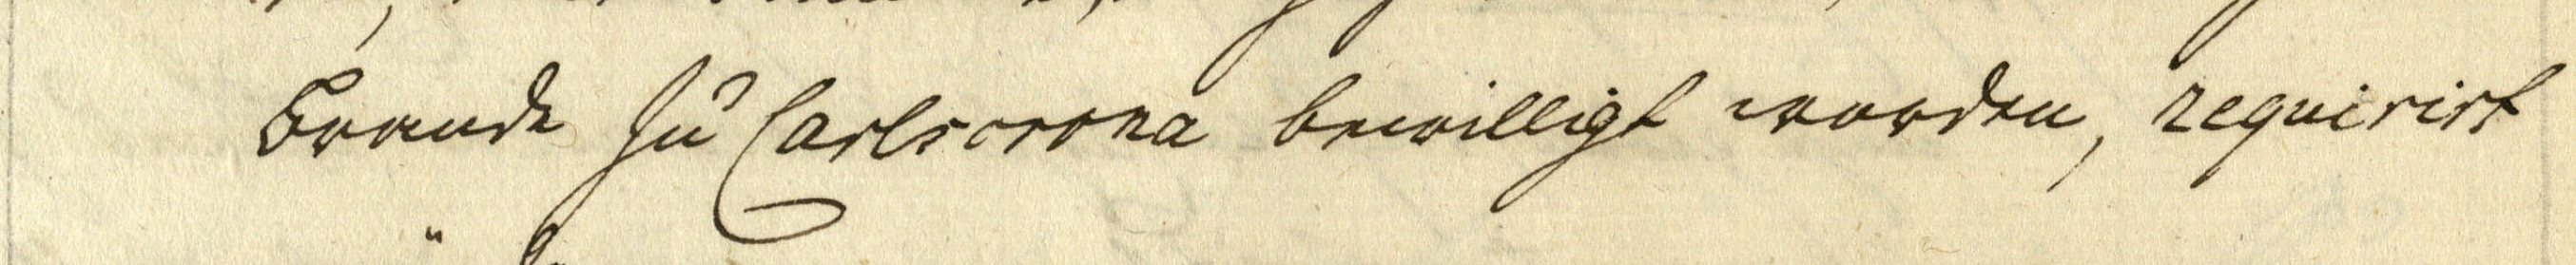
Brande zu Carlscrona bewilligt worden, requirirt
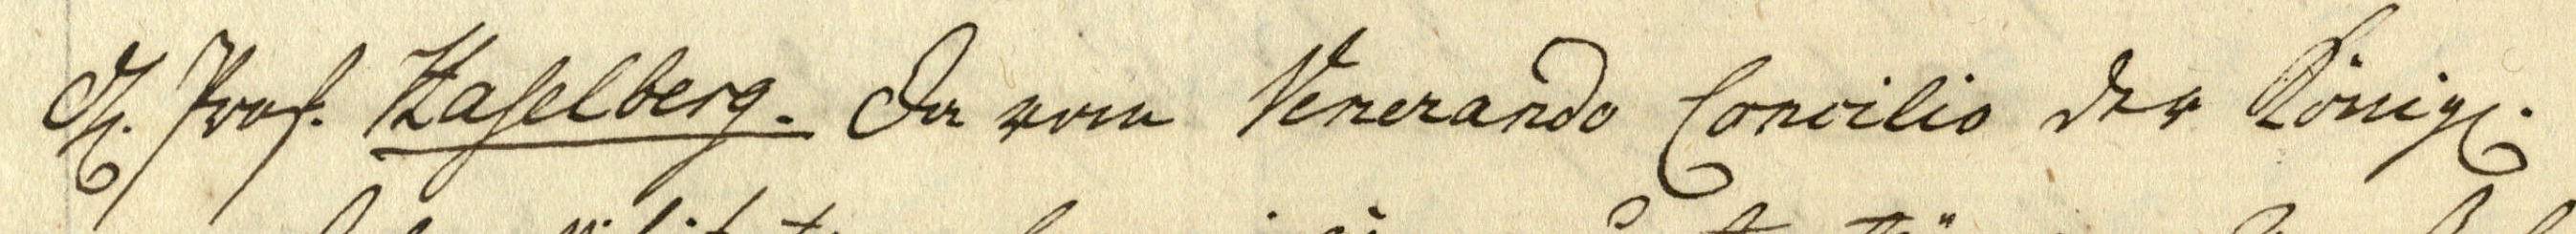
dh. Prof. Haselberg. Da vom Venerando Concilio der Königl.
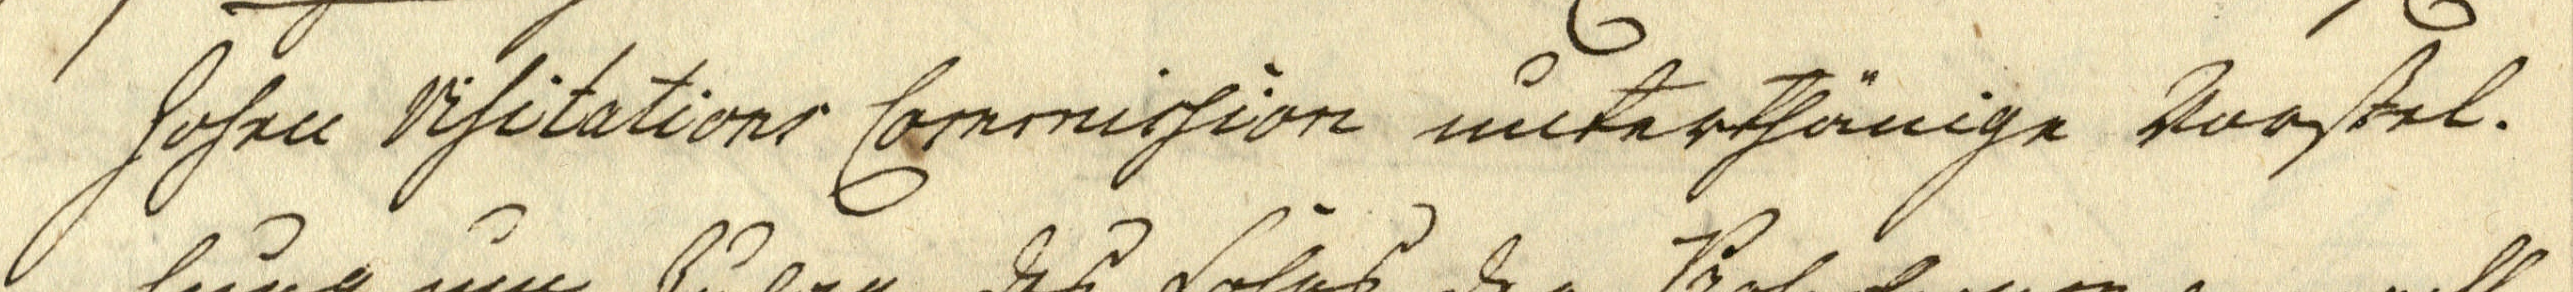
hohen Visitations Commission unterthänige Vorstel-
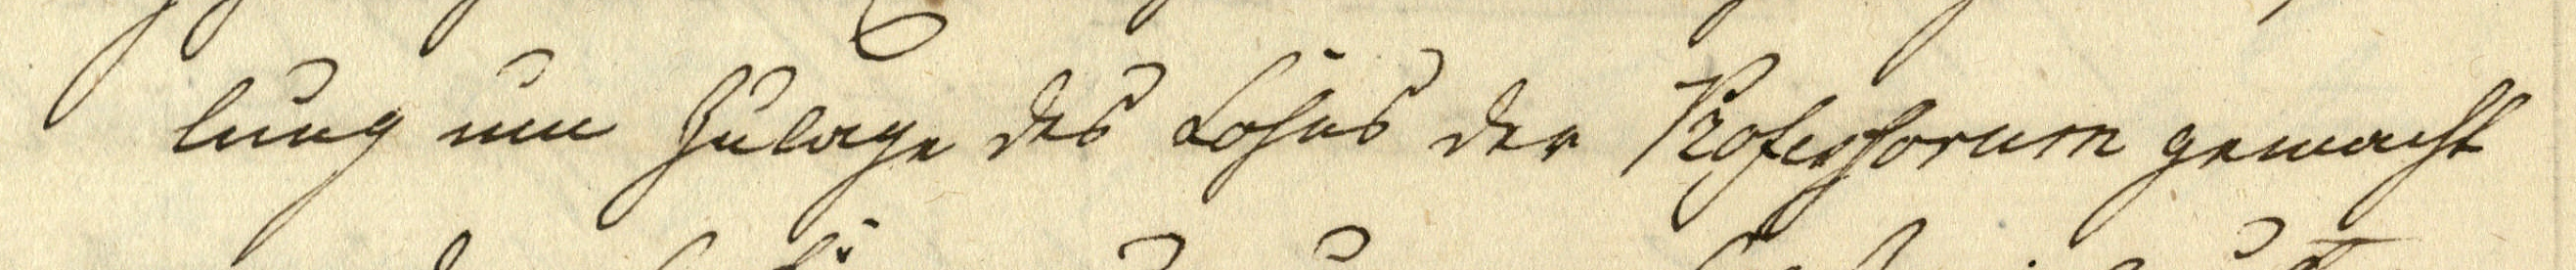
lung um Zulage des Lohns der Professorum gemacht
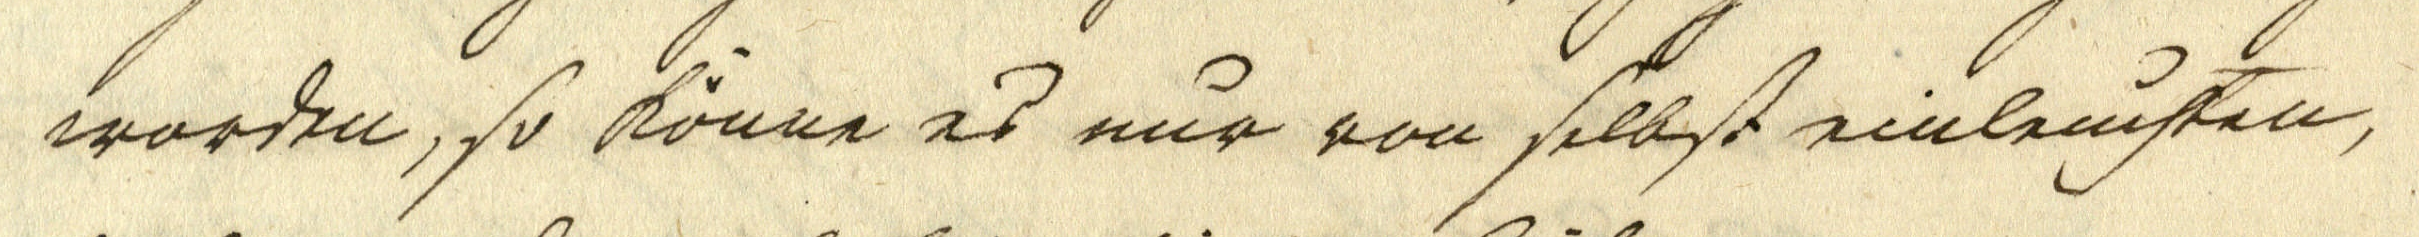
worden, so könne es nur von selbst einleuchten,
